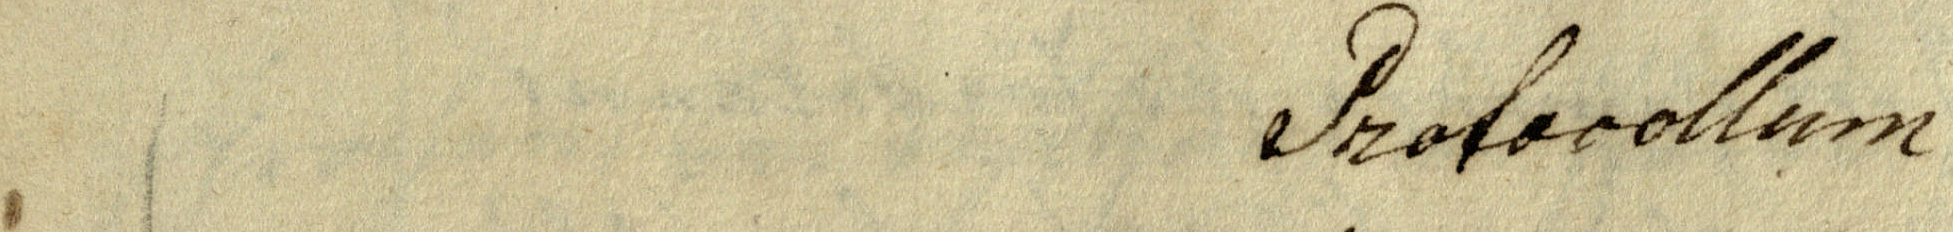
Protocollum
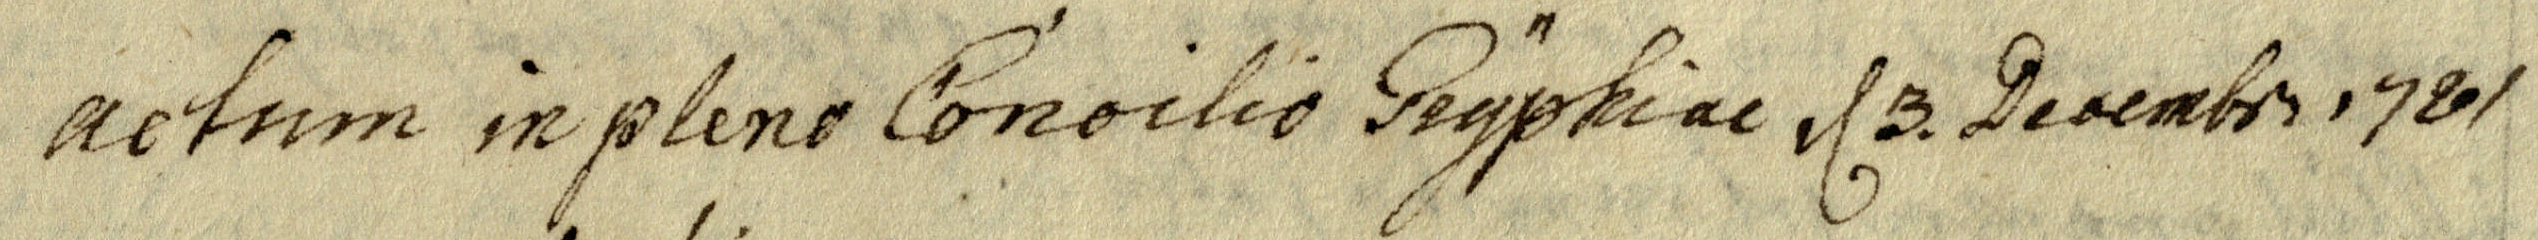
actum in pleno Concilio Grÿphiae d. 3. Decembr: 1781
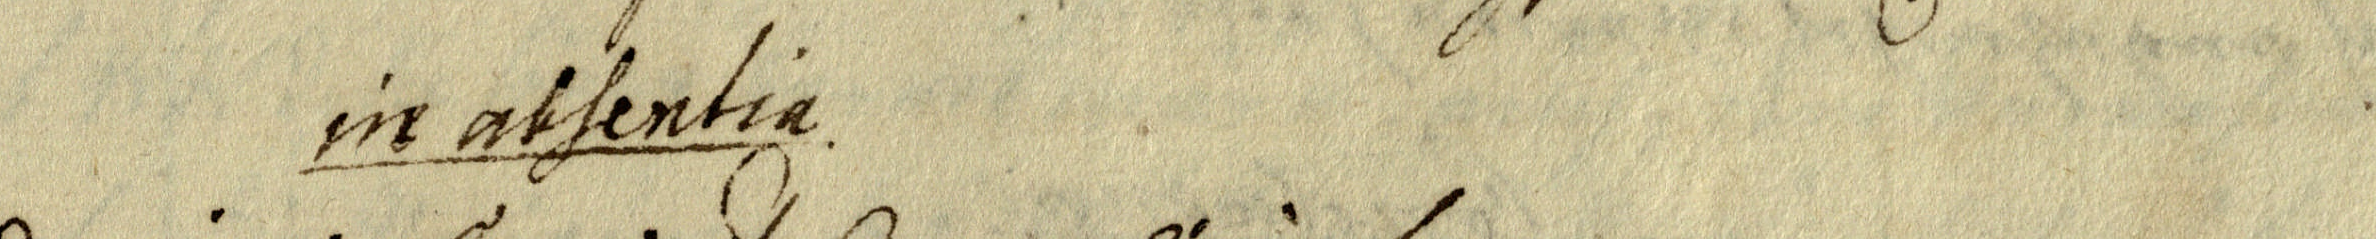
in absentia
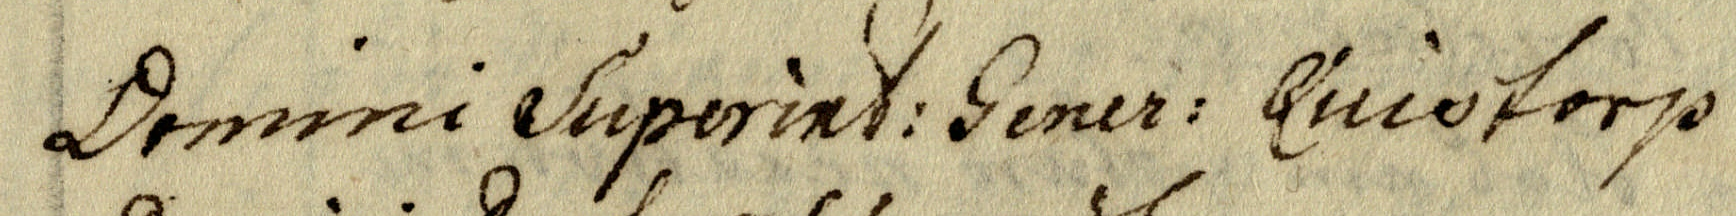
Domini Superint:Gener: Quistorp
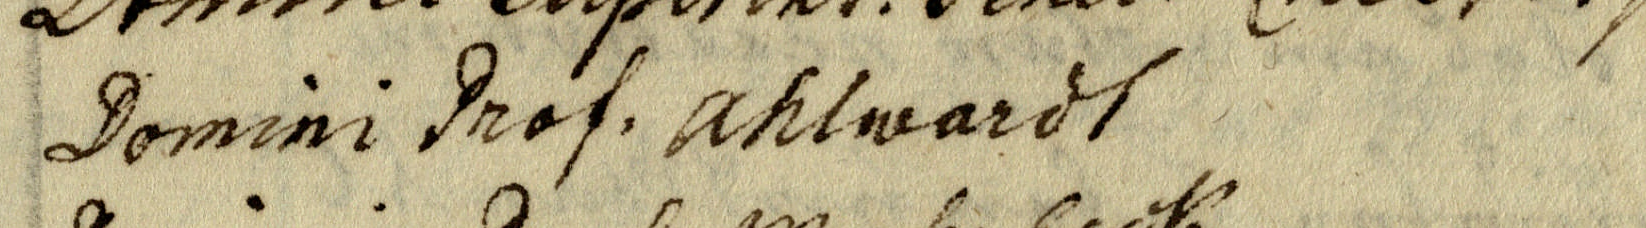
Domini Prof. Ahlwardt
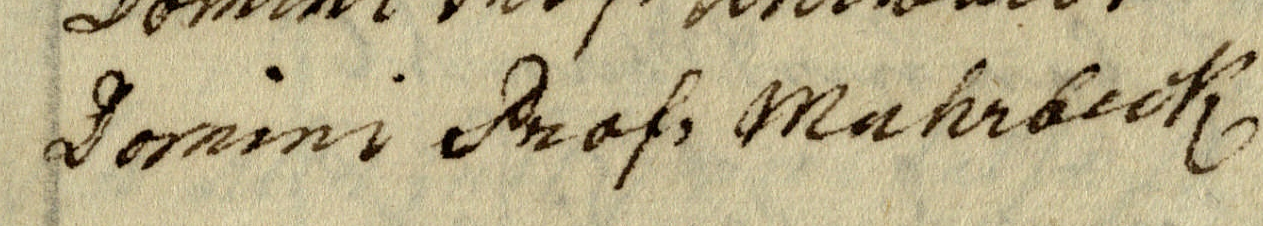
Domini Prof. Muhrbeck
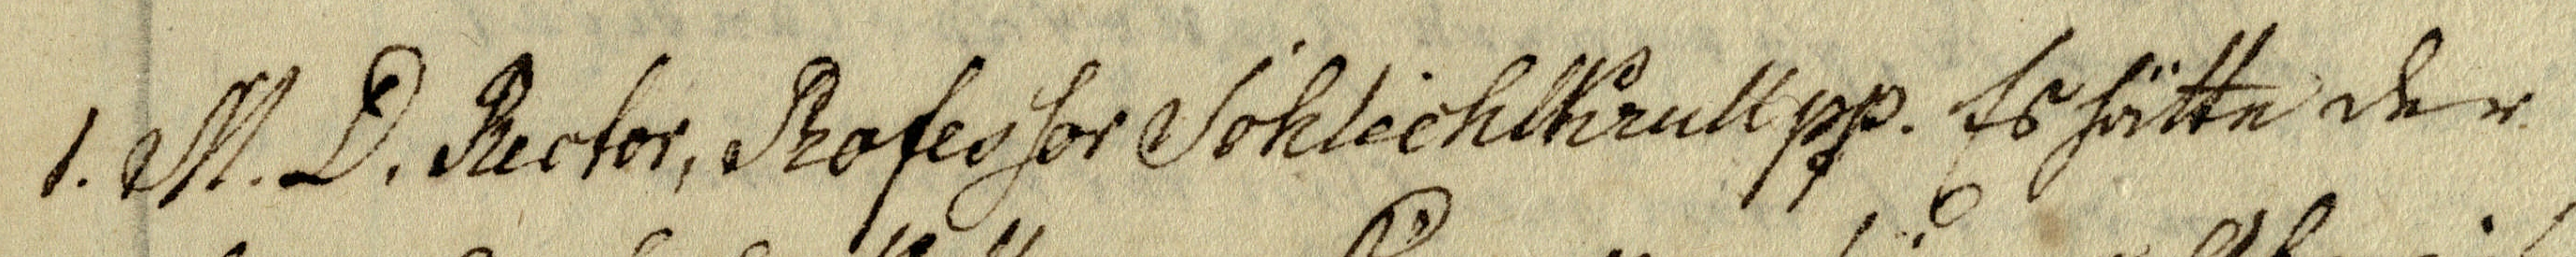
1. M. D. Rector, Professor Schlichtkrull pp. Es hätte der
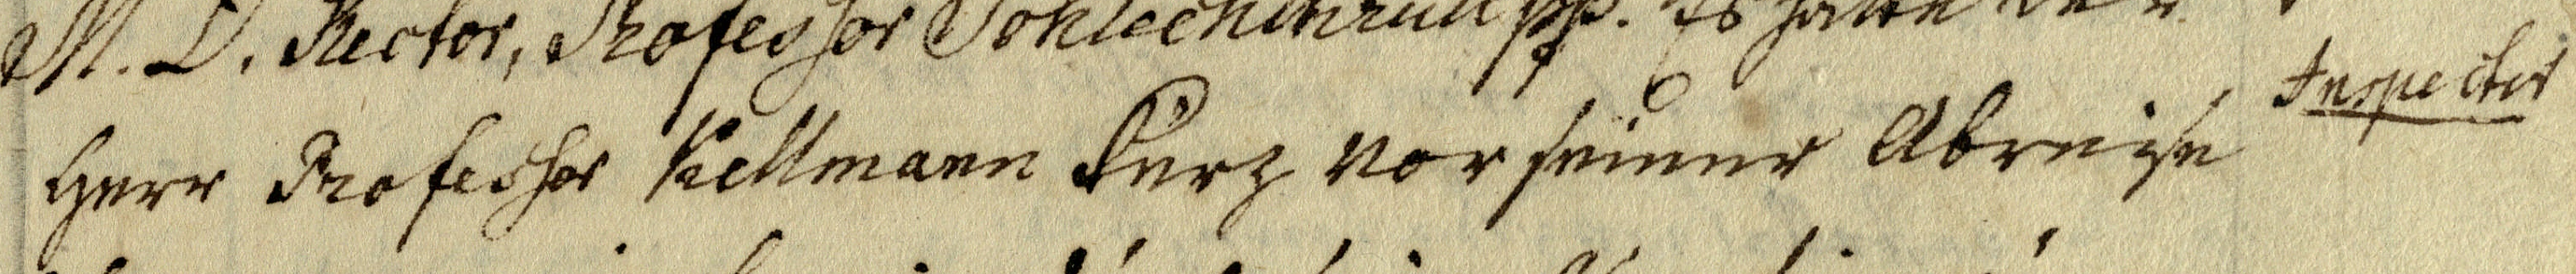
Herr Professor Kellmann kurz vor seiner Abreise
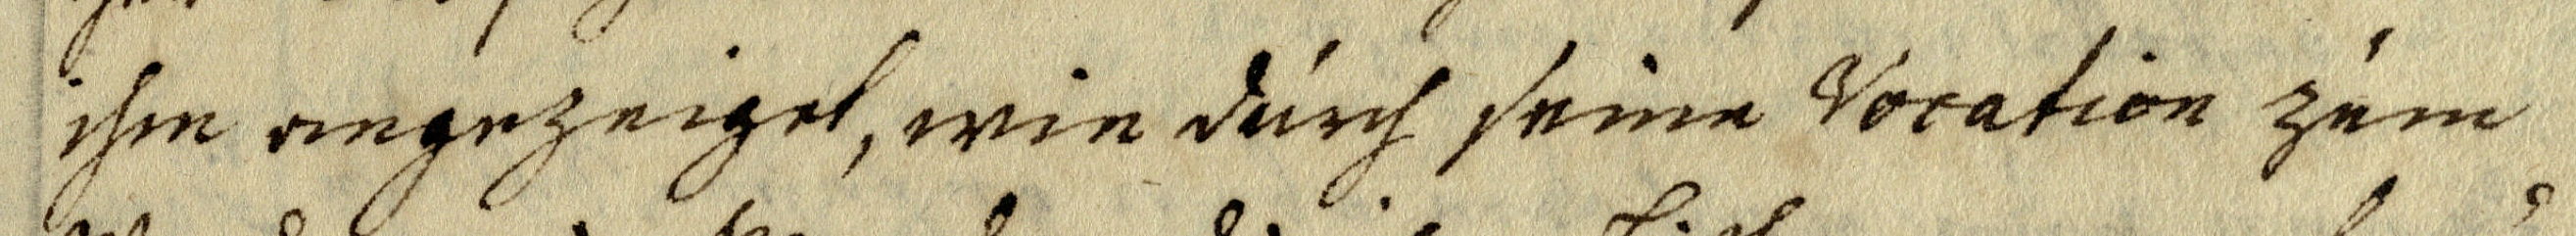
ihm angezeiget, wie durch seine Vocation zum
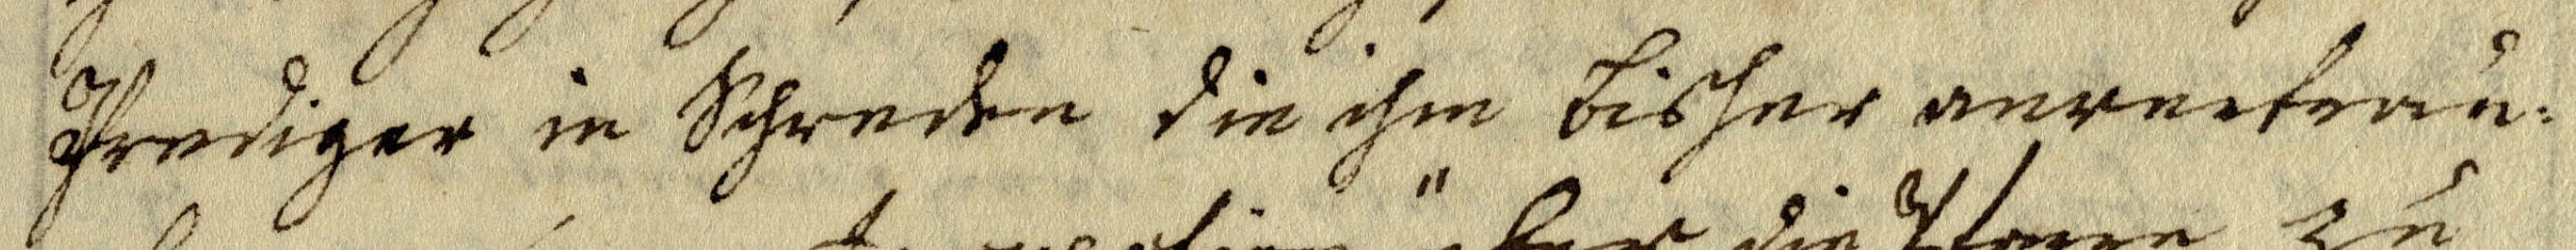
Prediger in Schweden die ihm bisher anvertrau¬
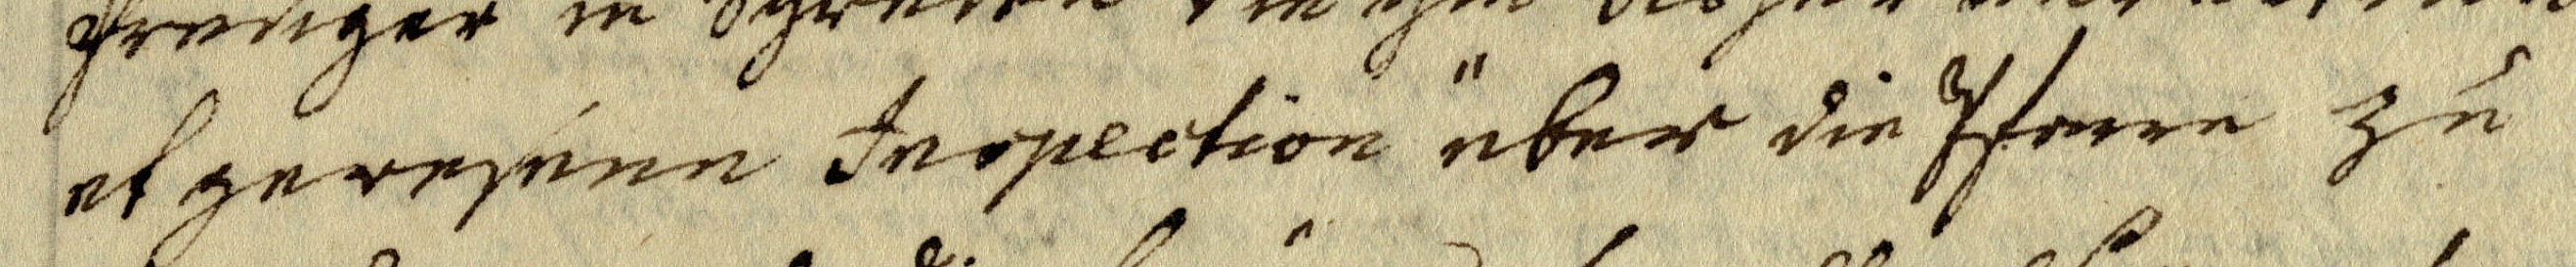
et gewesene Inspection über ide Pfarre zu
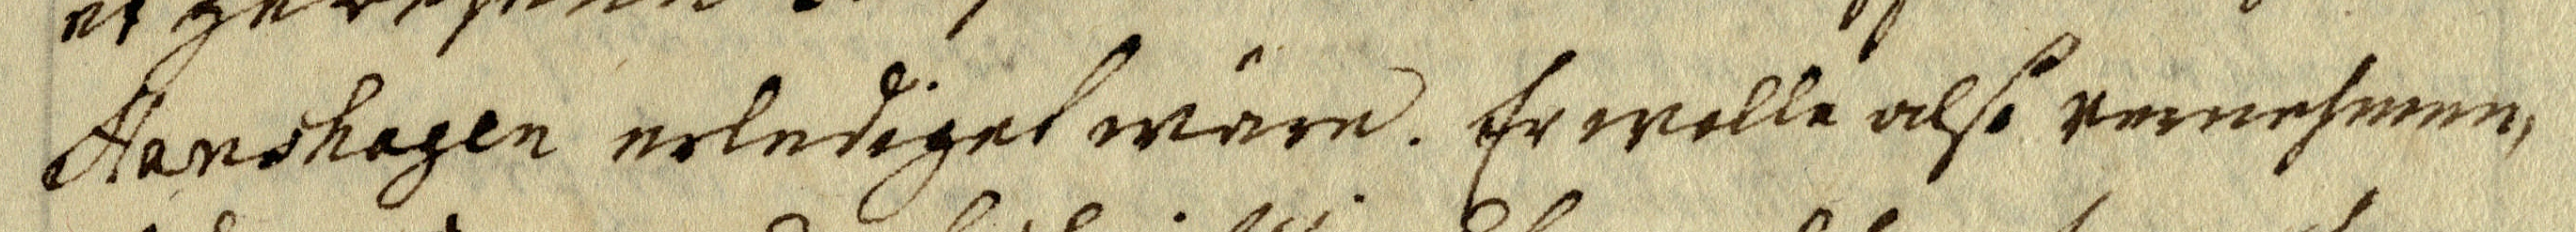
Hanshagen erledigt wäre. Er wolle also vernehmen,
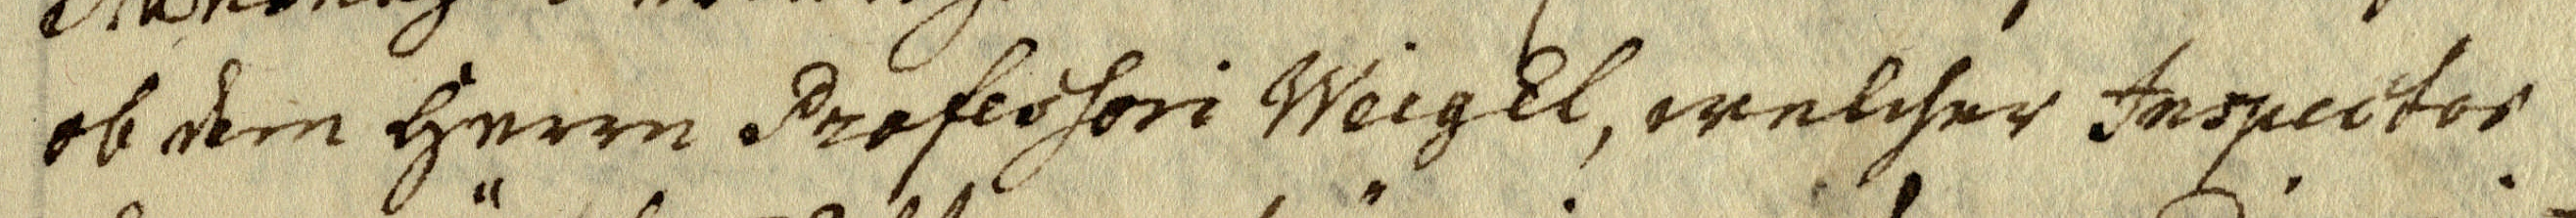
ob dem Herrn Professori Weigel, welcher Inspector
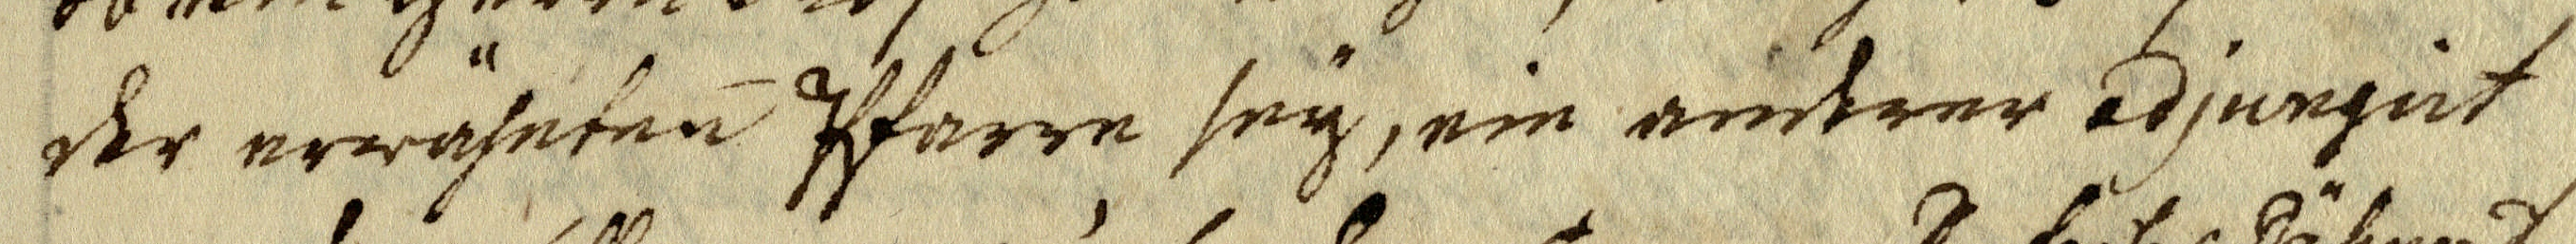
der erwähnten Pfarre seÿ ein anderer adjungirt
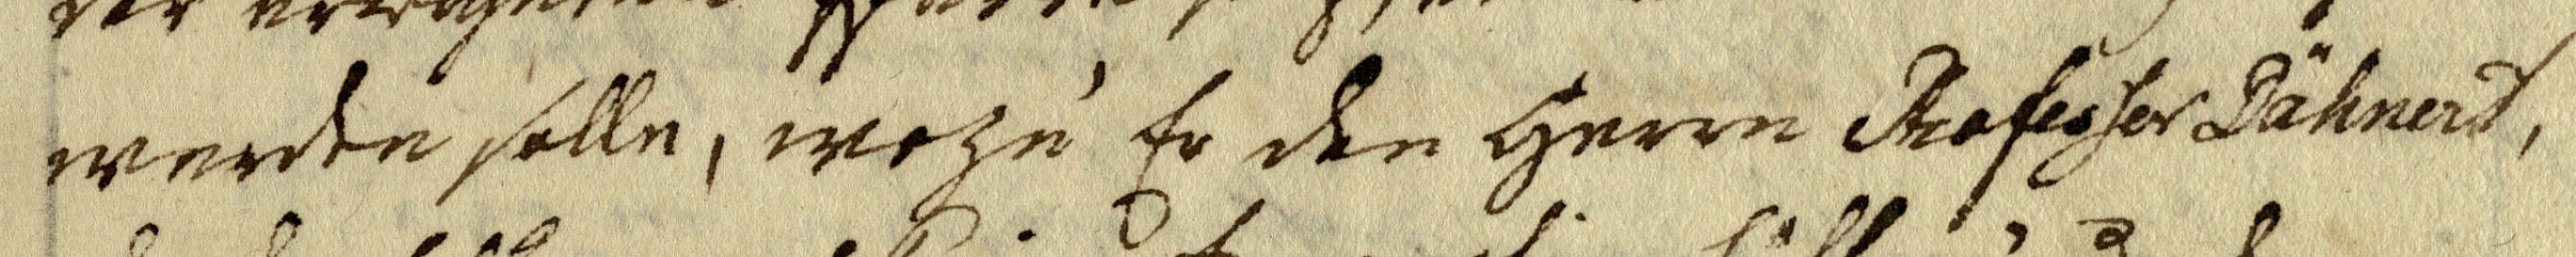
werden solle, wozu Er den Herrn Professor Dähnert,
